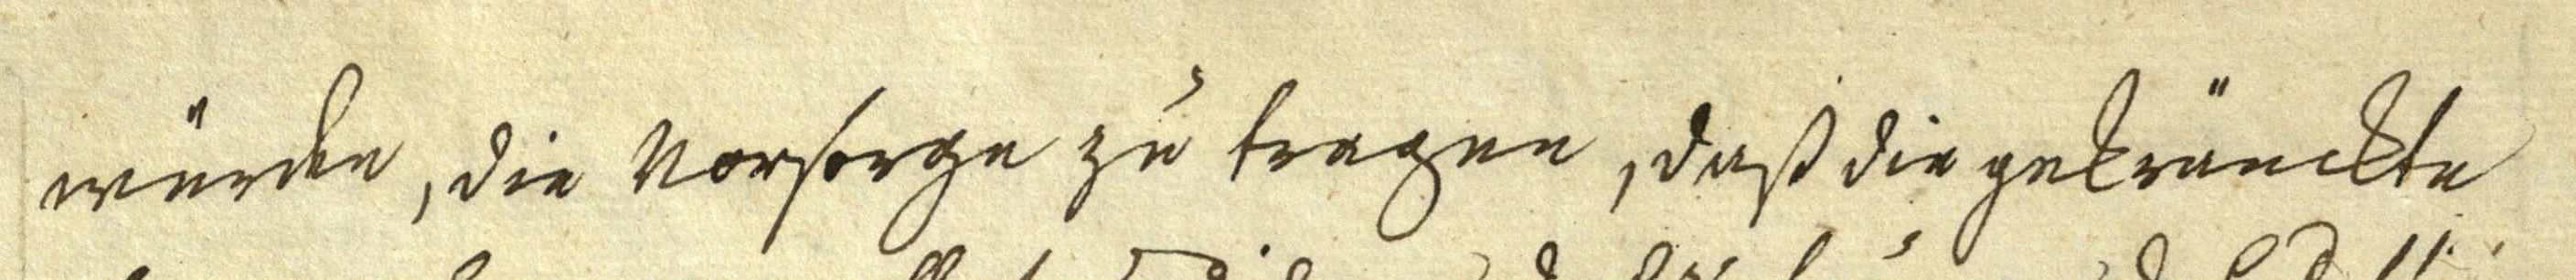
würde, die Vorsorge zu tragen, daß die gekränckte
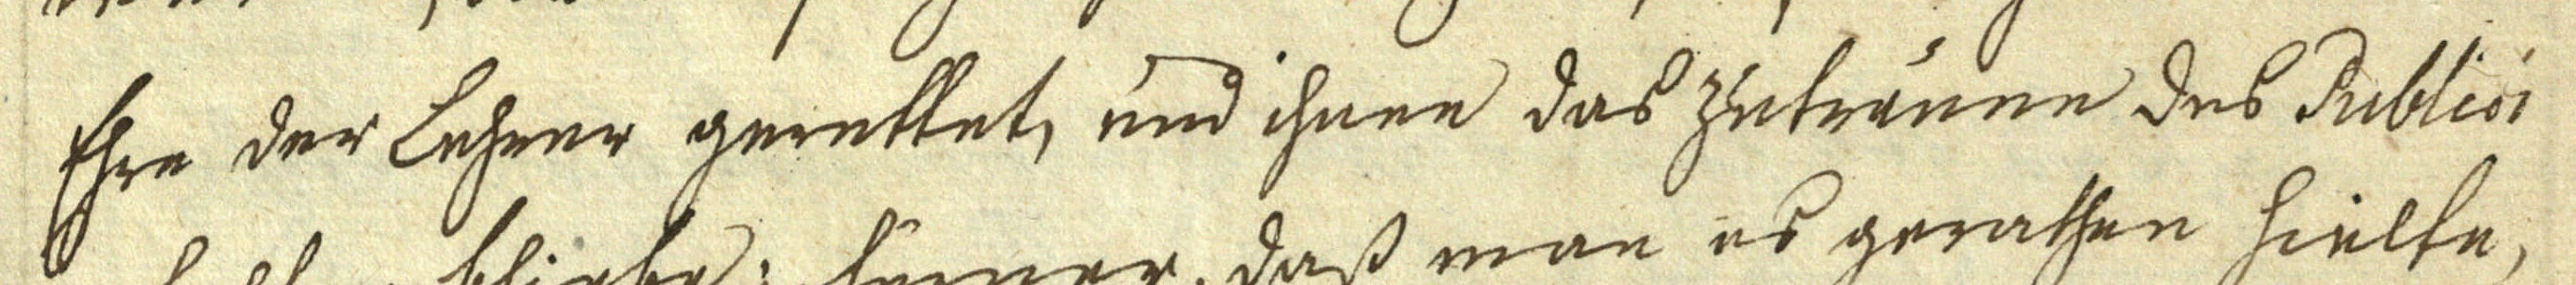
Ehre der Lehrer gerettet, und ihnen das Zutrauen des Publici
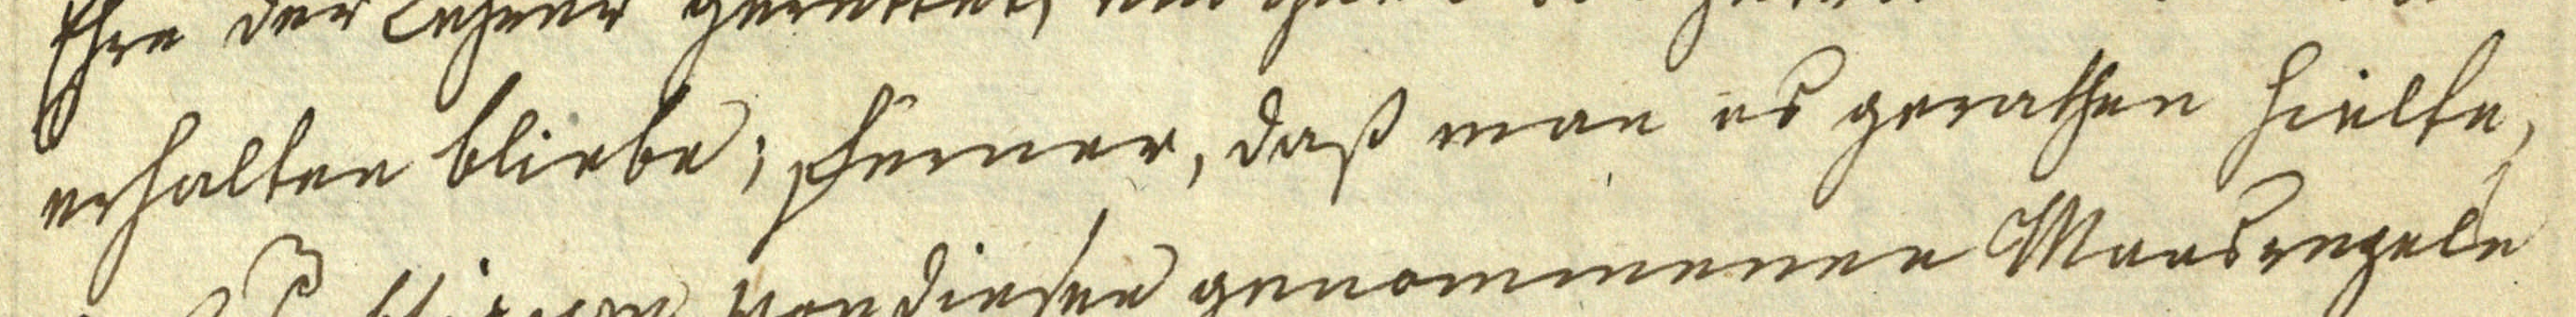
erhalten bliebe, ferner, daß man es gerathen hielte,
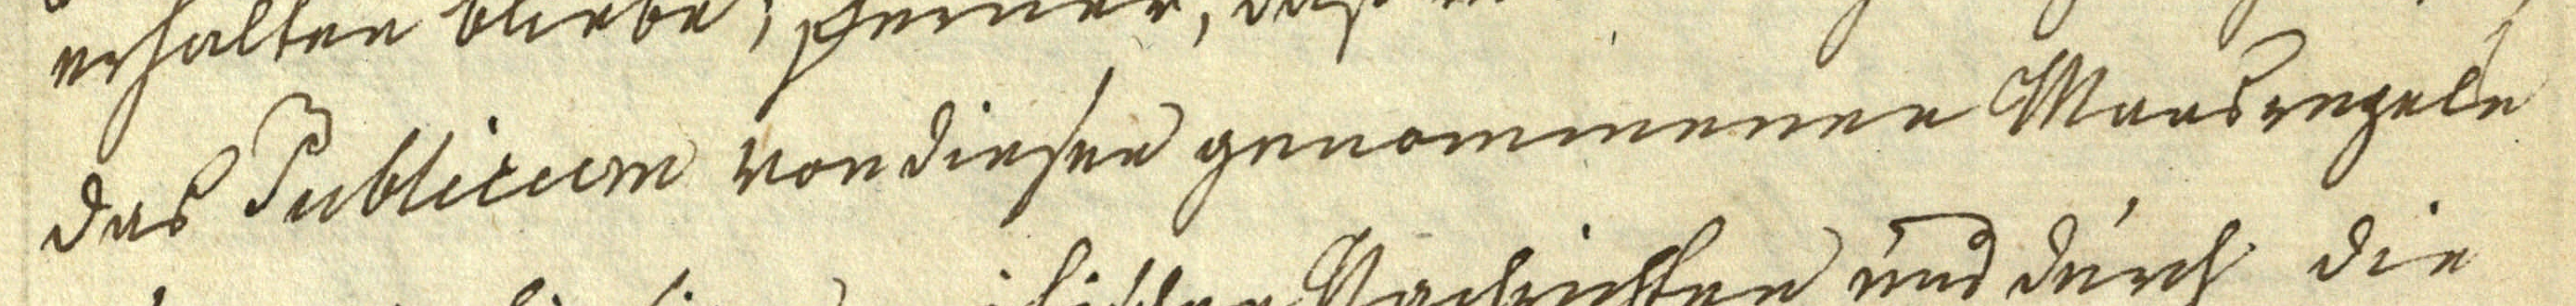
das Publicum von diesen genommenen Maasregeln
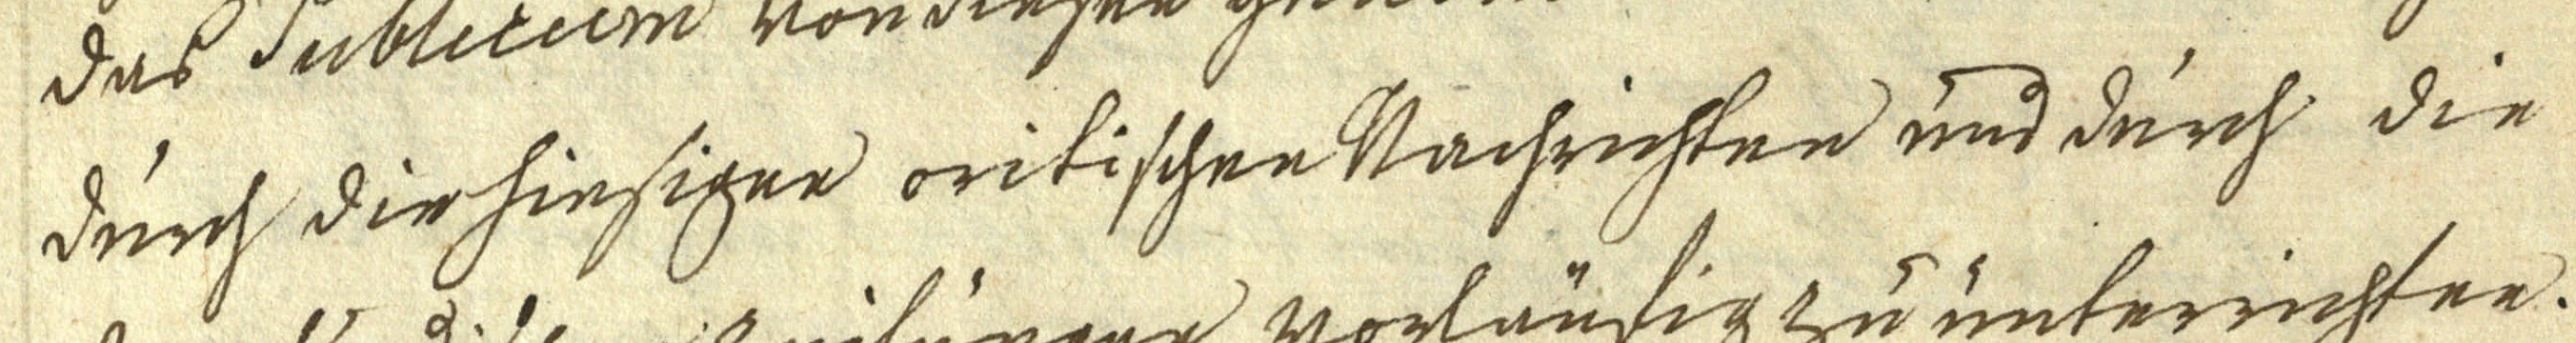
durch die hiesigen critischen Nachrichten und durch die
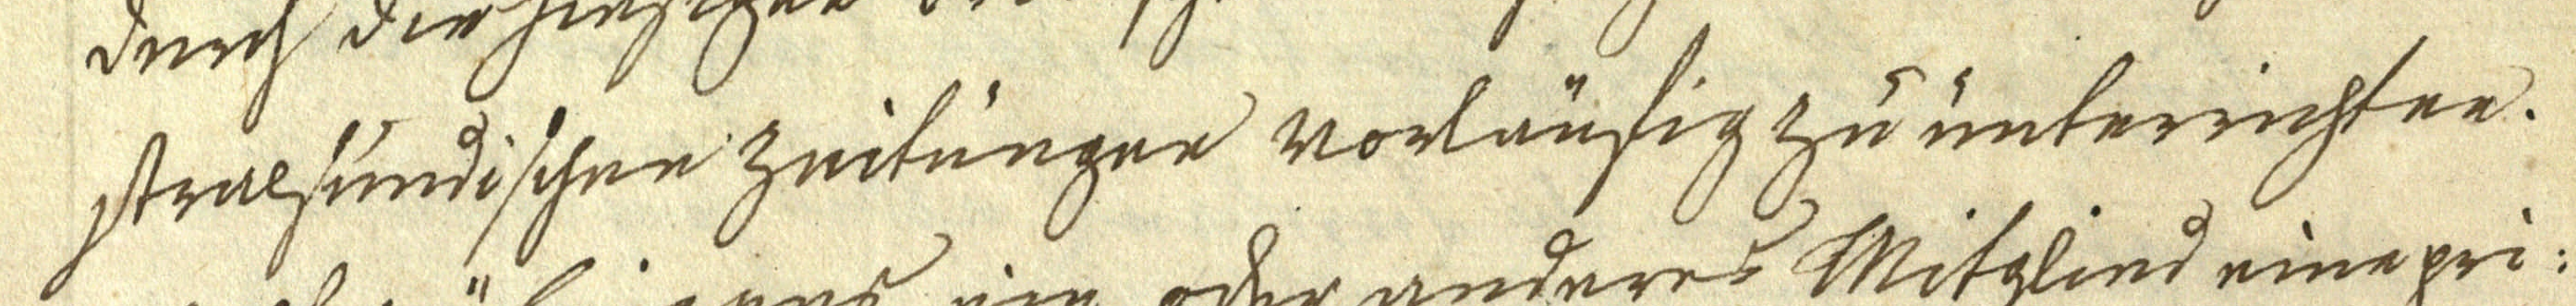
stralsundischen Zeitungen vorläufig zu unterrichten.
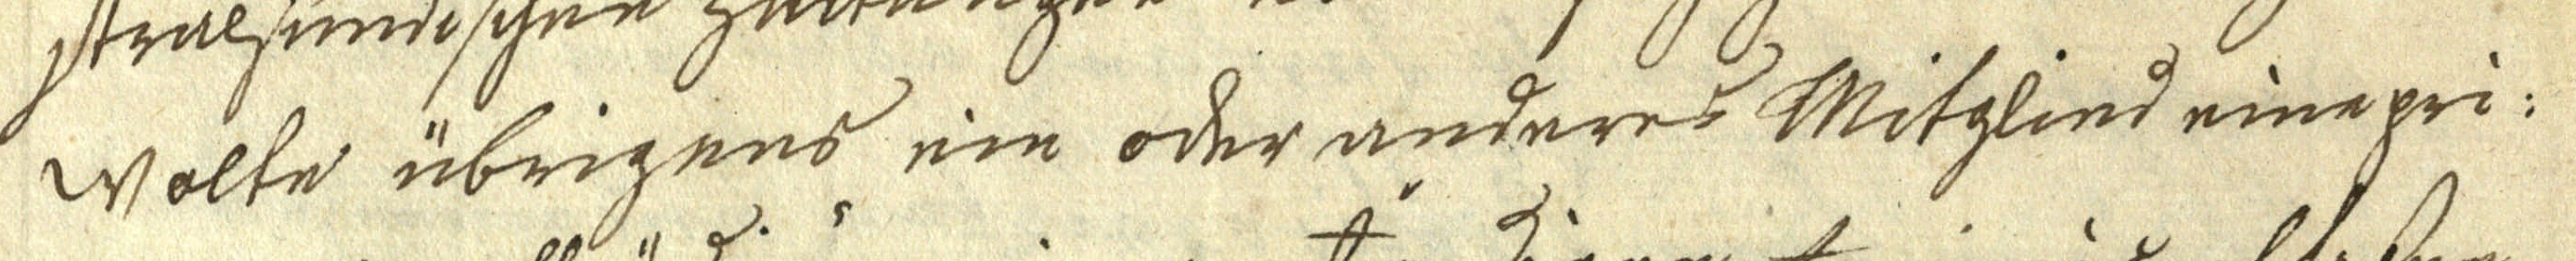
Wolte übrigens ein oder anderes Mitglied eine pri¬
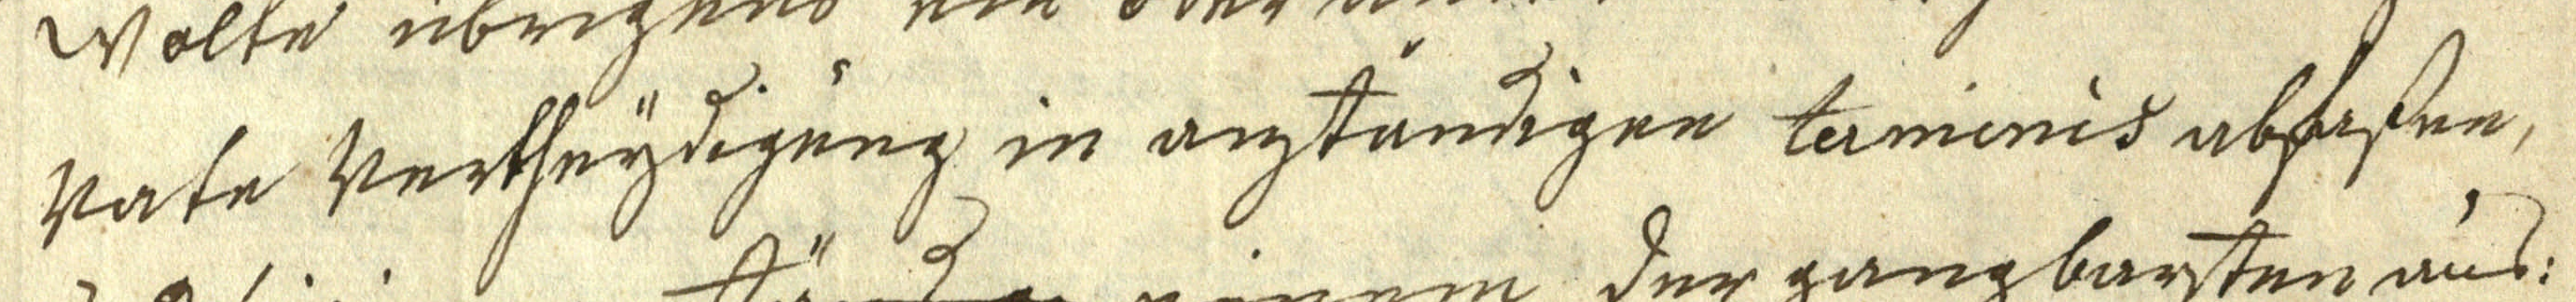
vate Vertheÿdigung in anständigen terminis abfaßen,
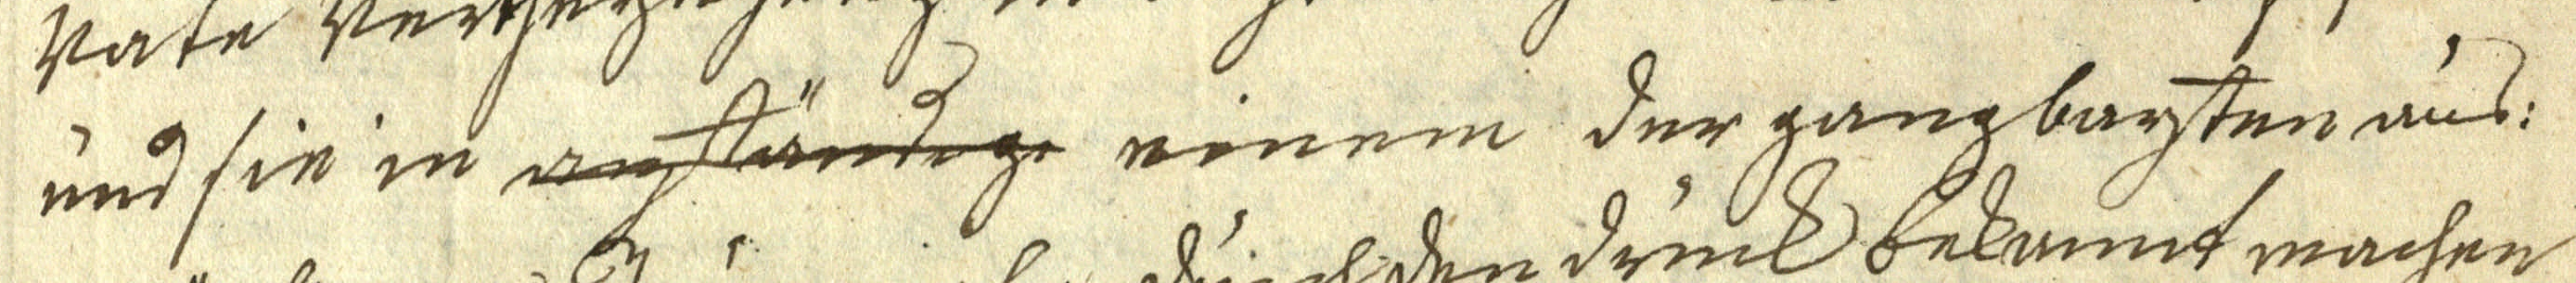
und sie in einem der gangbarsten aus¬
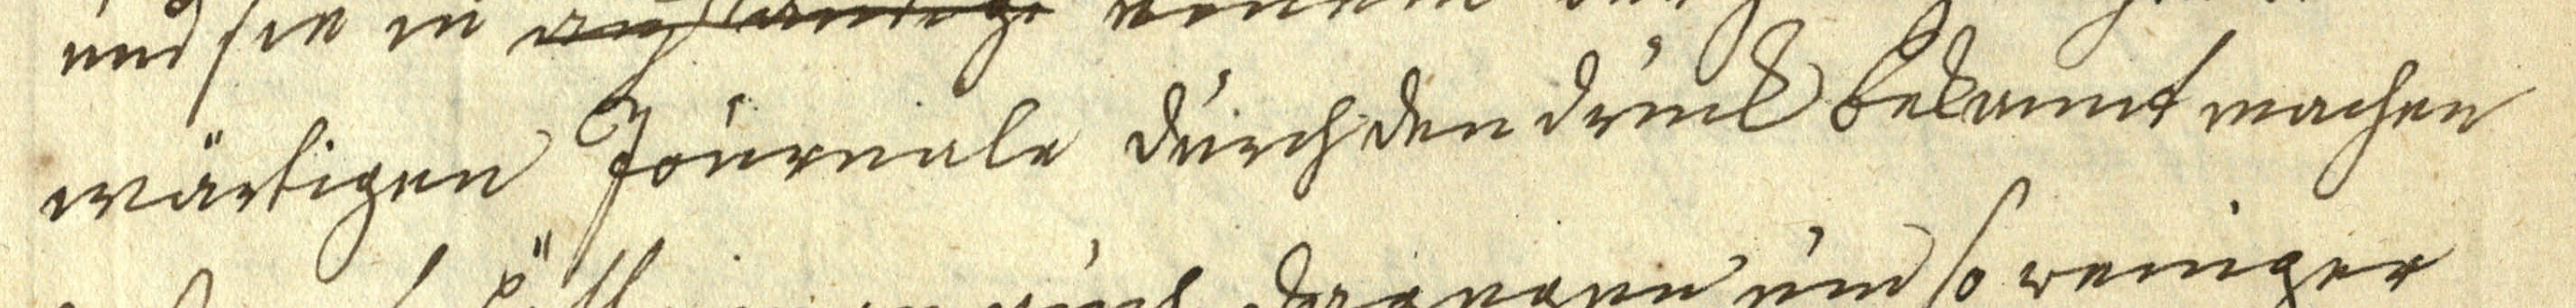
wärtigen Journale durch den dieses bekannt machen
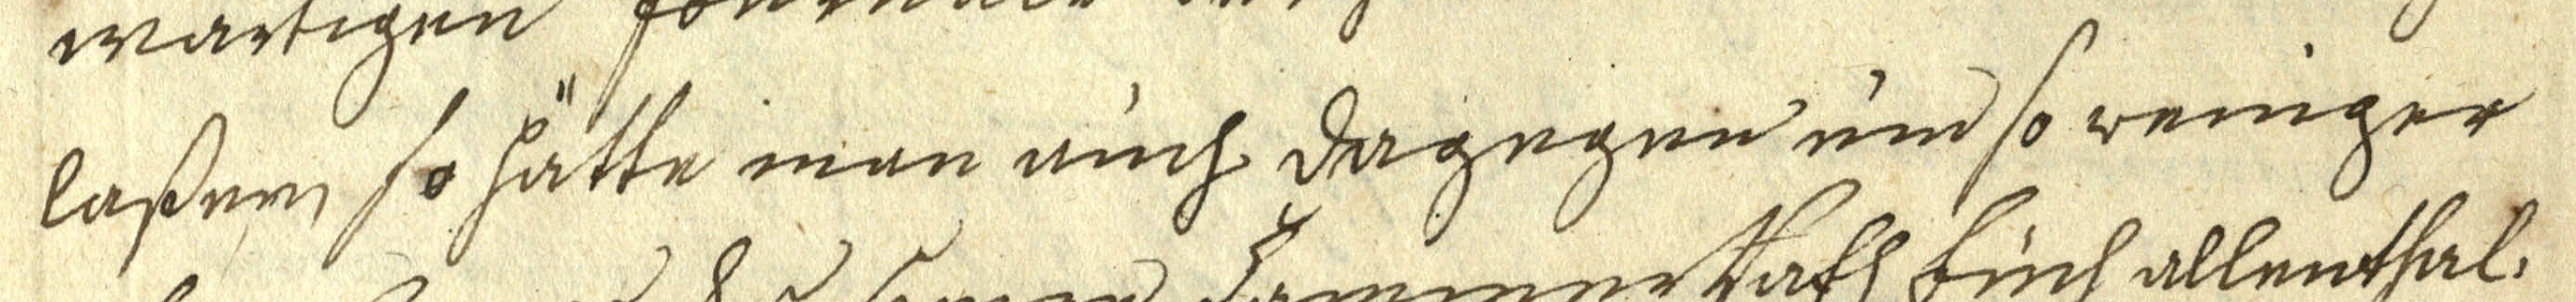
laßen, so hätte man auch dagegen um so weniger
